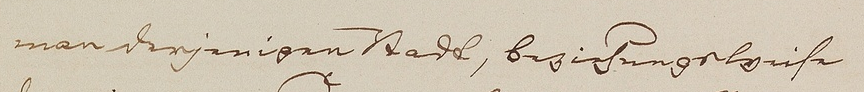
man derjenigen Stadt, beziehungsweise
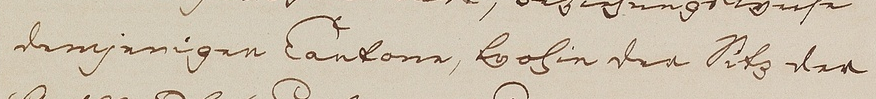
demjenigen Cantone, wohin der Sitz der
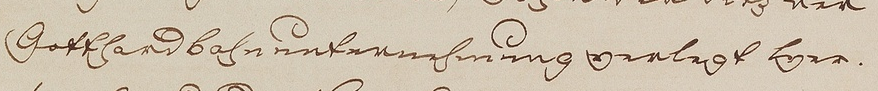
Gotthardbahnunternehmung verlegt wer-
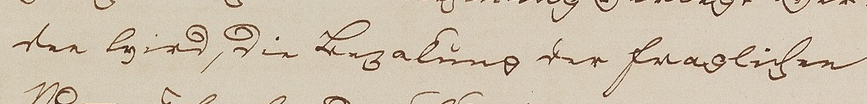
den wird, die Bezalung der fraglichen
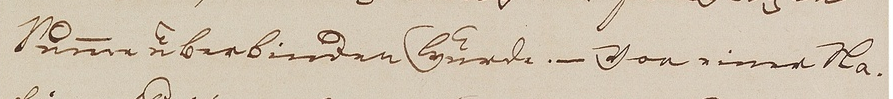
Summe überbinden würde. – Von einer Na-
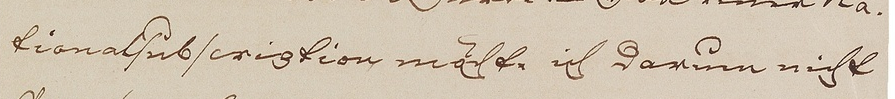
tionalsubscription möchte ich darum nicht
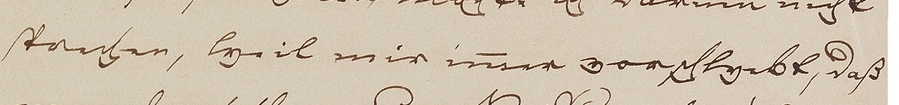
sprechen, weil mir immer vorschwebt, daß
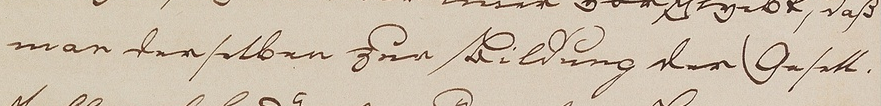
man derselben zur Bildung der Gesell-
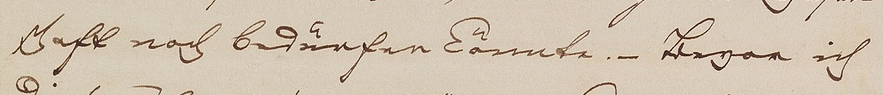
schaft noch bedürfen könnte. – Bevor ich
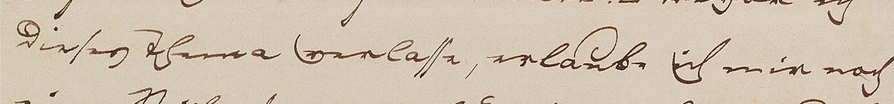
dieses Thema verlasse, erlaube ich mir noch
